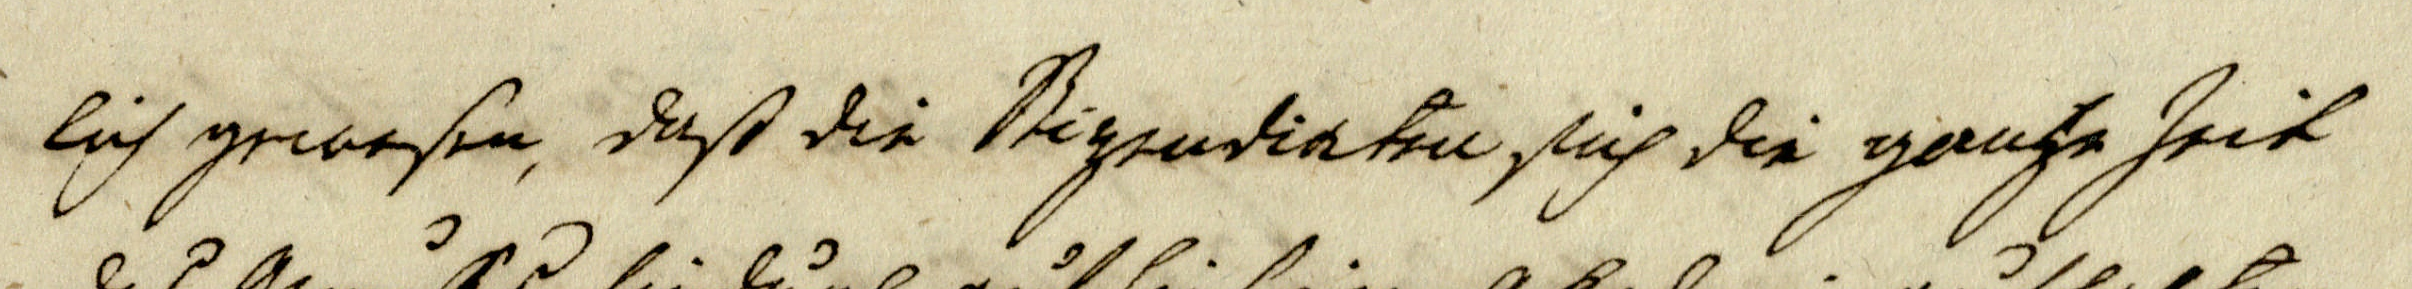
lich gewesen, daß die Stipendiaten sich die gantze Zeit
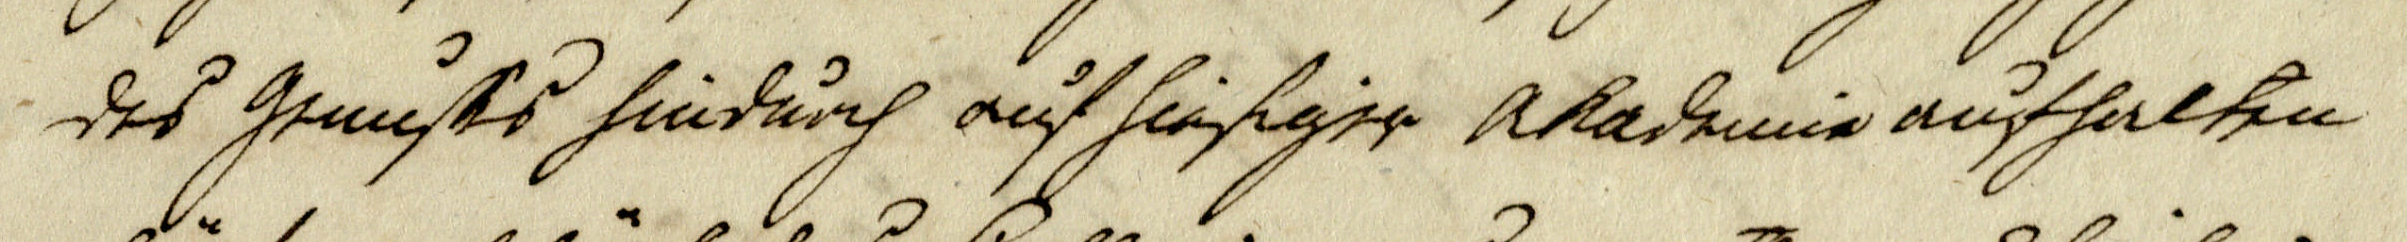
des Genusses hindurch auf hiesiger Akademie aufhalten
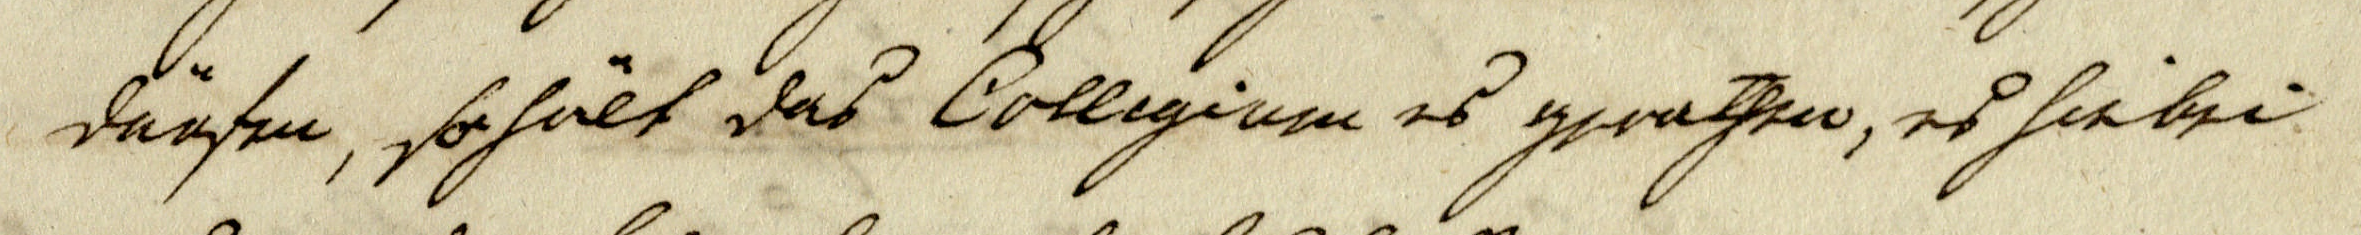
dürfen, so hält das Collegium es gerathen, es hiebei
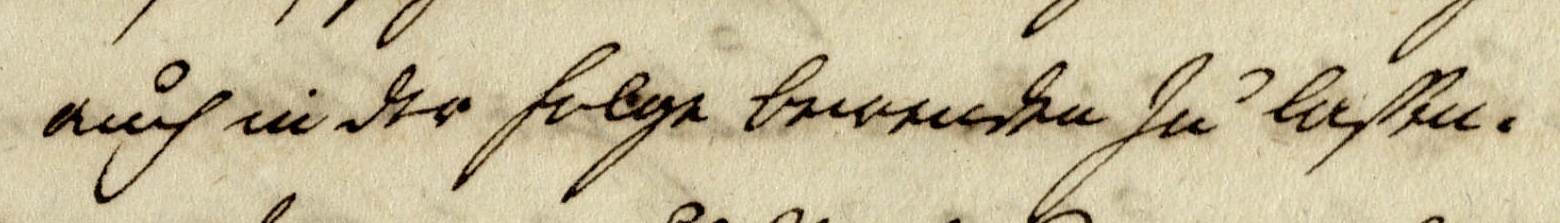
auch in der Folge bewenden zu lassen.
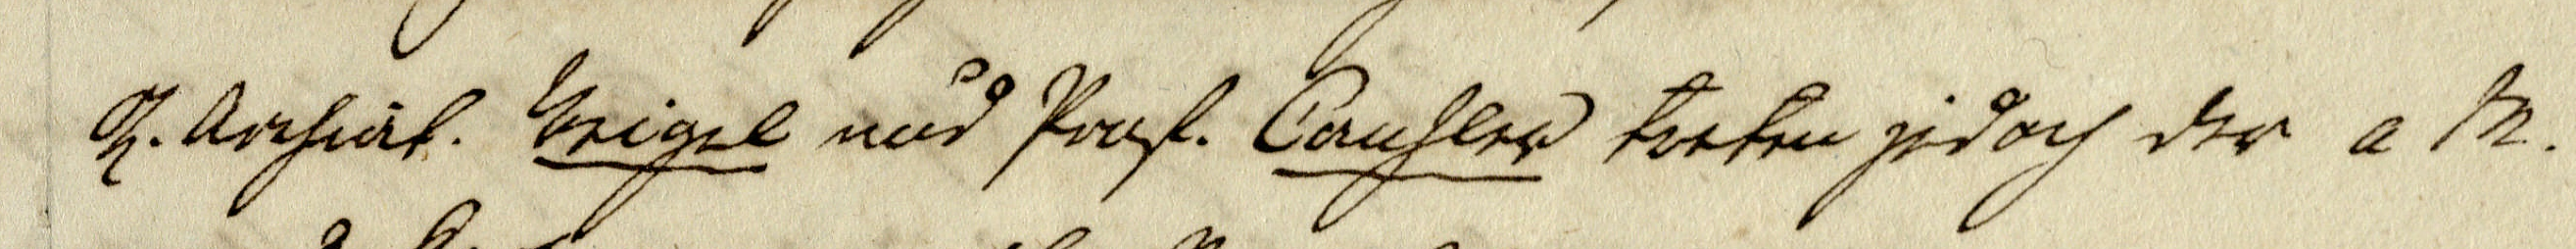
dh. Archiat. Weigel und Prof. Canzler treten jedoch der a M.
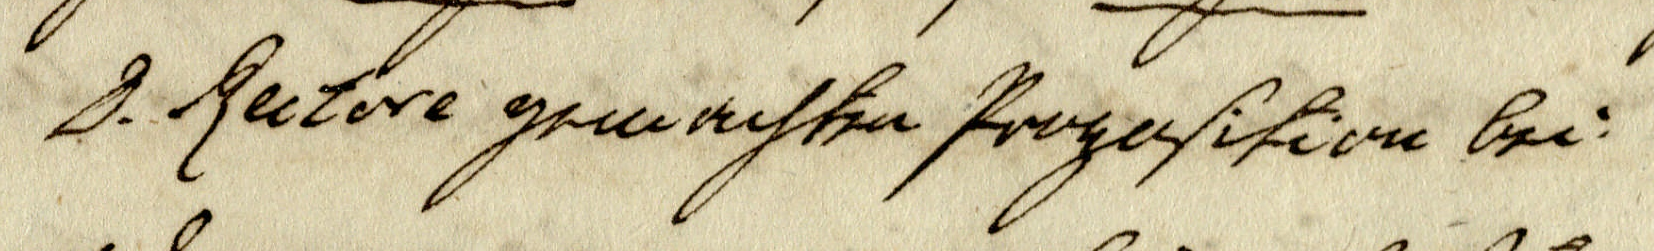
D. Rectore gemachten Proposition bei.
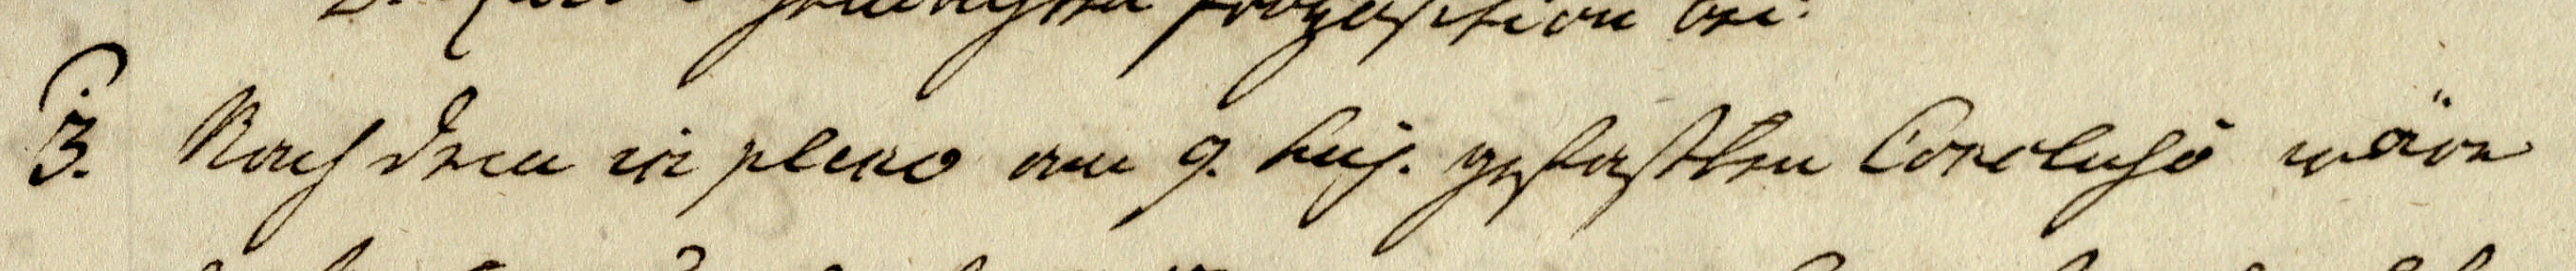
3. Nach dem in pleno am 9. huj. gefaßten Concluso wäre
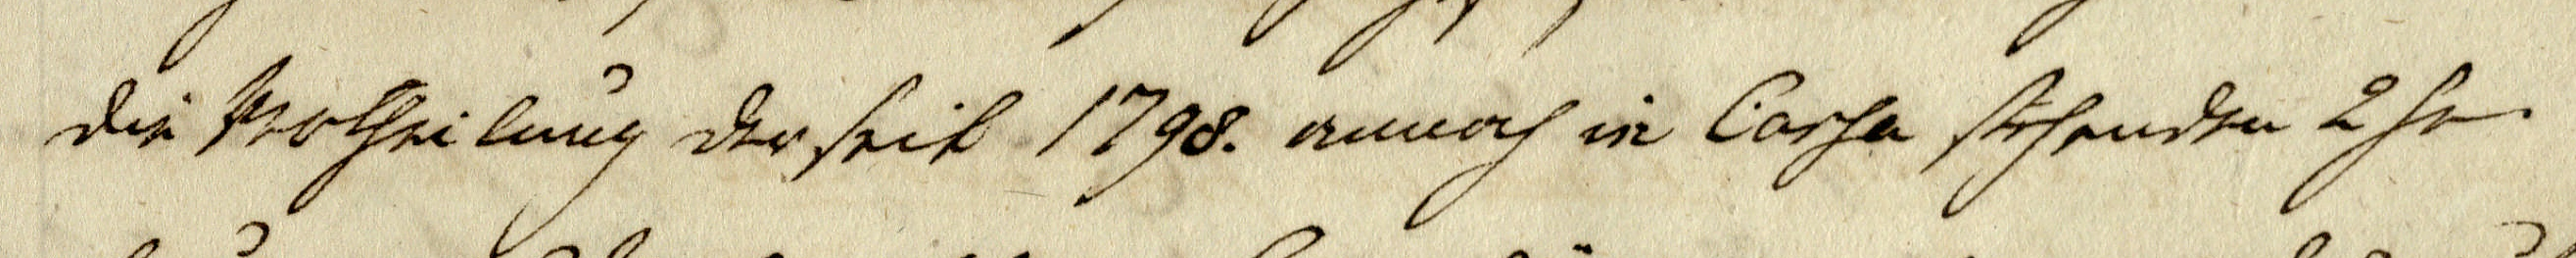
die Vertheilung der seit 1798. annoch in Cassa stehenden 2 He¬
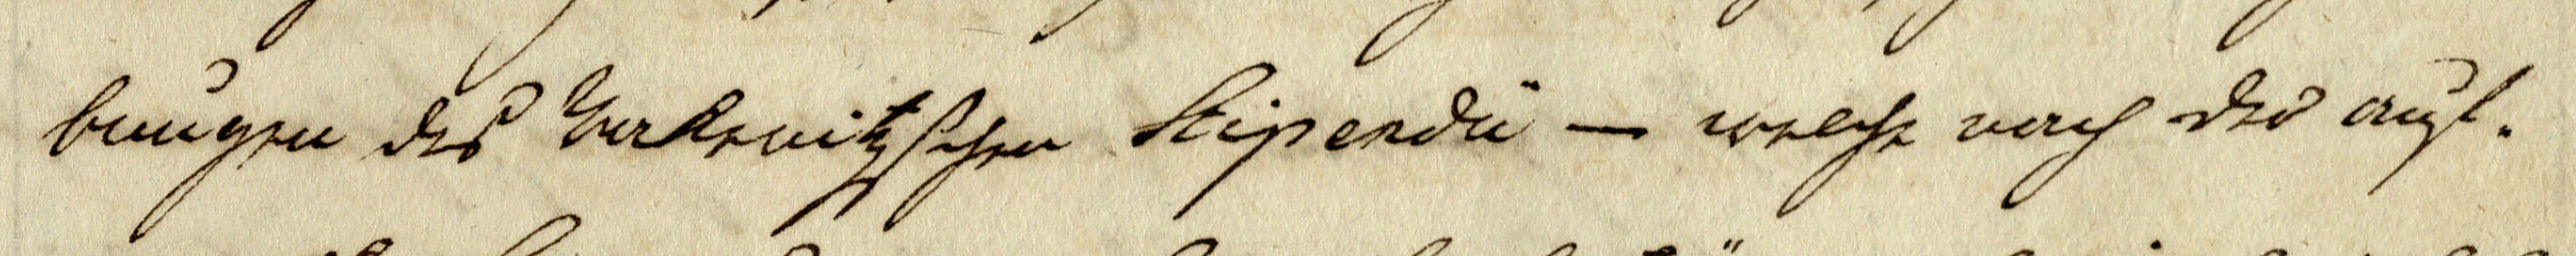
bungen des Wakenitzschen Stipendii welche nach der auf¬
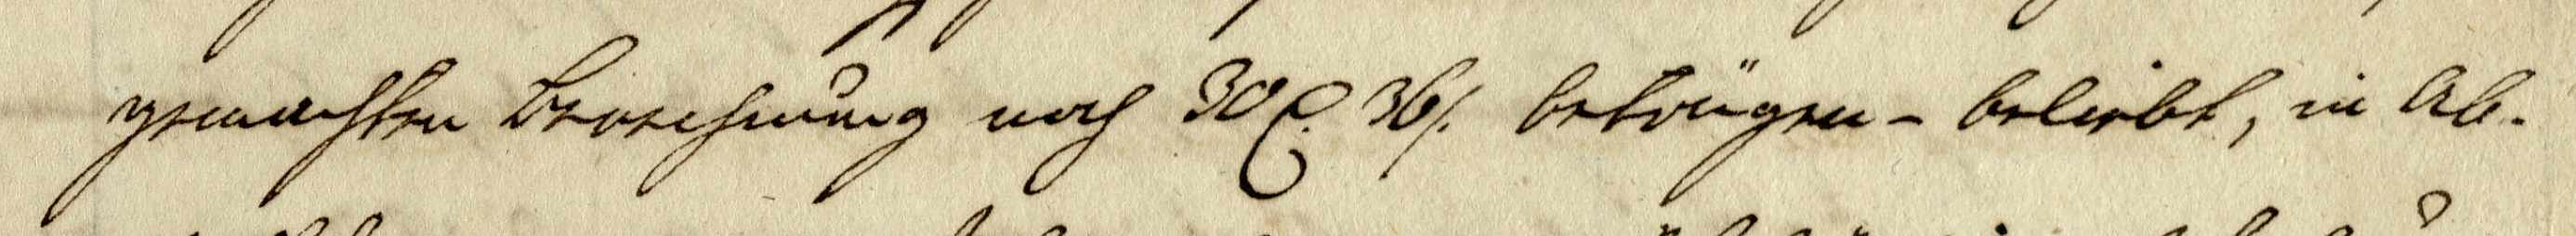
gemachten Berechnung nach 30 l. 36 s. betrügen beliebt, in Ab¬
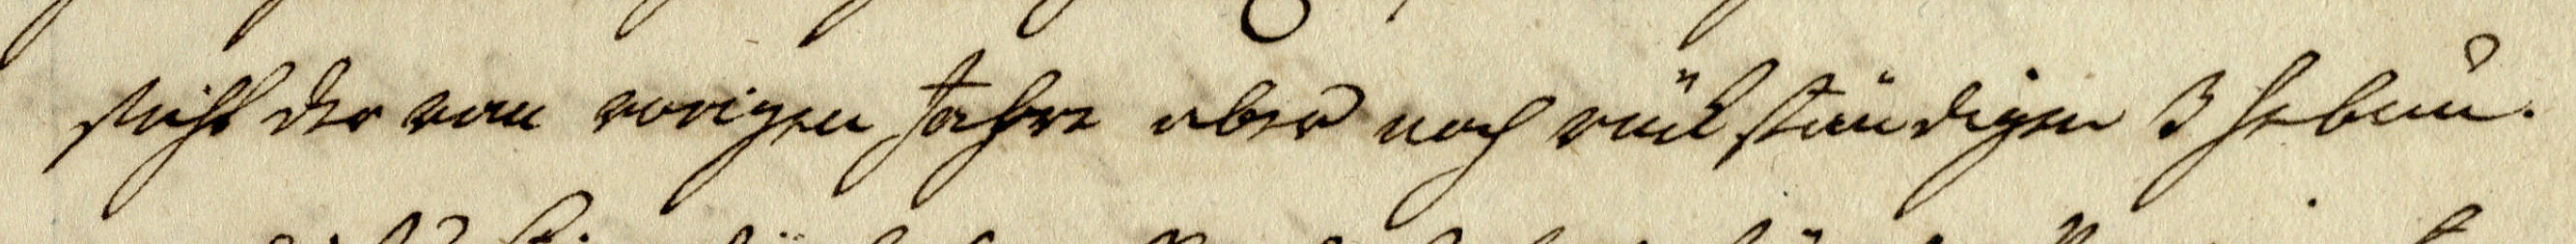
sicht der vom vorigen Jahre aber noch rückständigen 3 Hebun¬
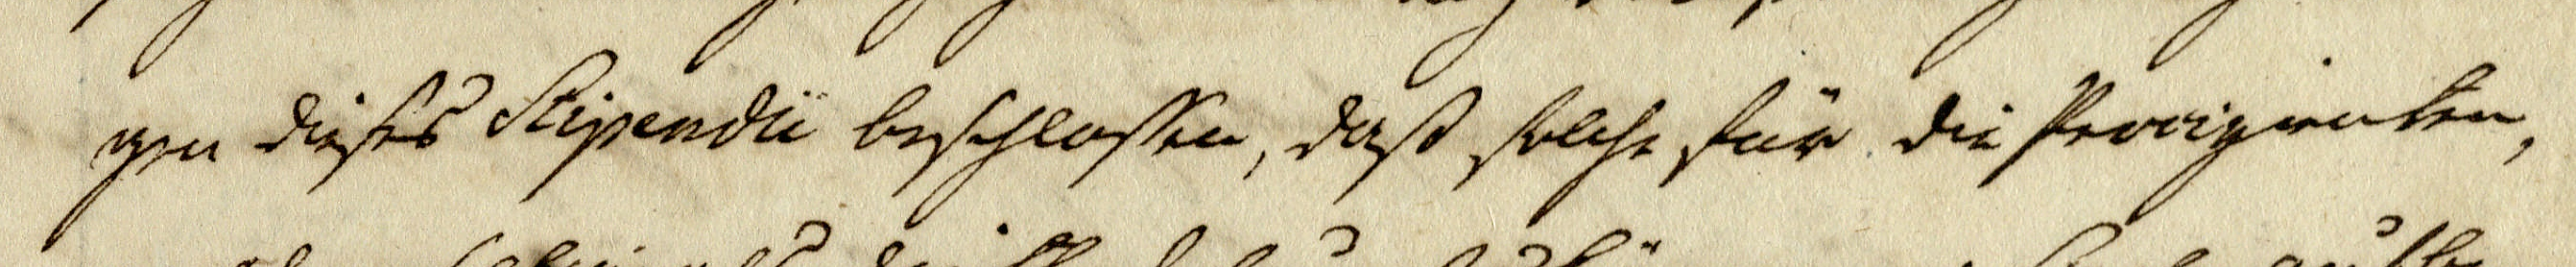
gen dieses Stipendii beschlossen, daß solche für die Percipienten,
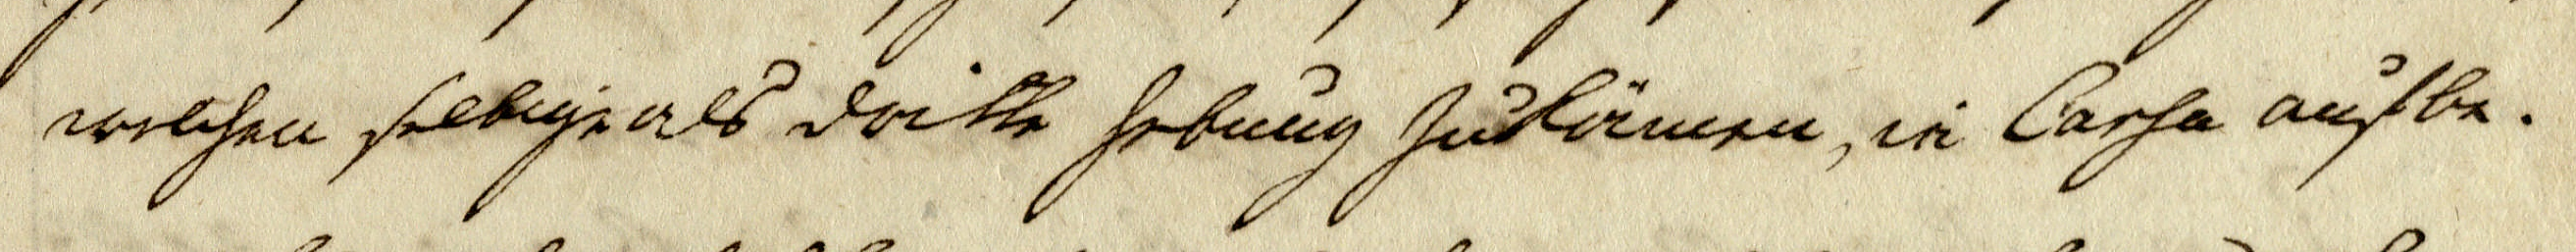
welchen selbige als dritte Hebung zukämen, in Cassa aufbe¬
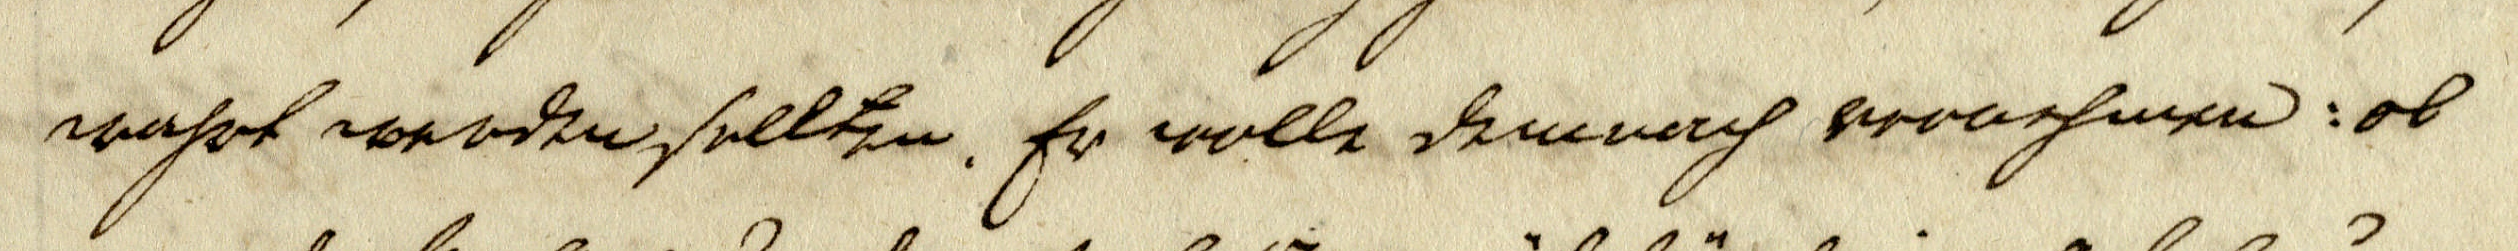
wahrt werden sollten. Er wolle demnach vernehmen : ob
